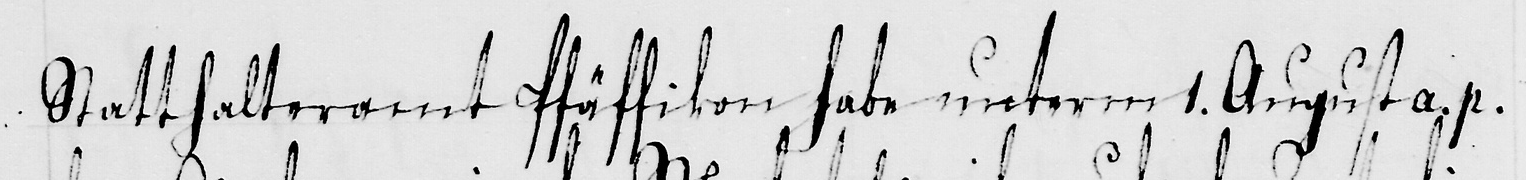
Statthalteramt Pfäffikon habe unterm 1. August a. p.
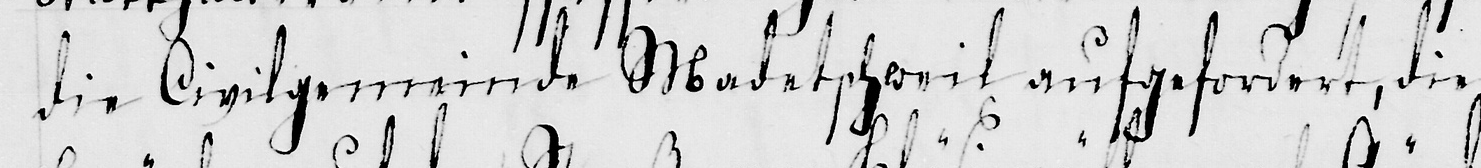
die Civilgemeinde Madetschwil aufgefordert, die
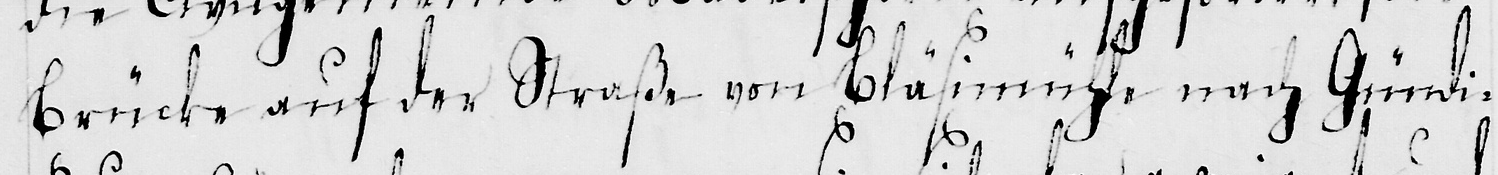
Brücke auf der Straße von Bläsimühle nach Gündi¬
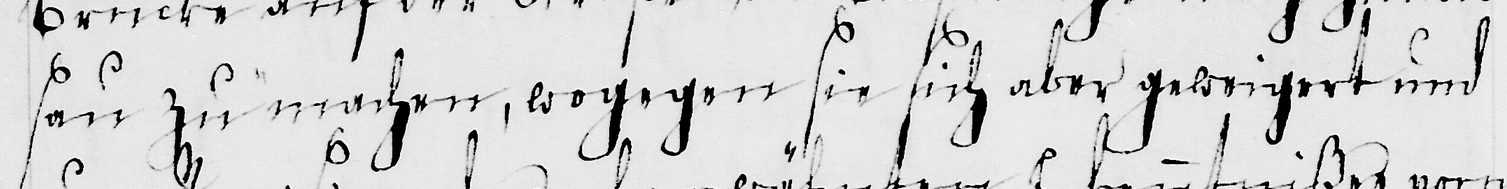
sau zu machen, wogegen sie sich aber geweigert und
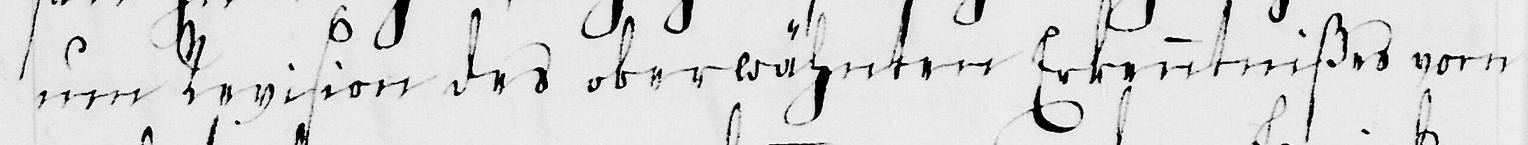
um Revision des oberwähnten Erkenntnißes vom
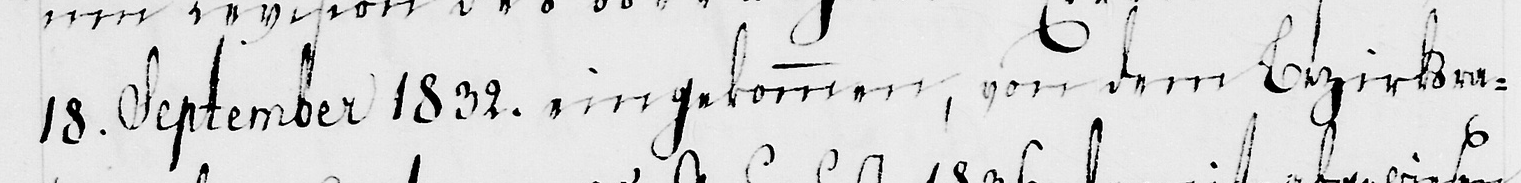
18. September 1832. eingekommen, von dem Bezirksra¬
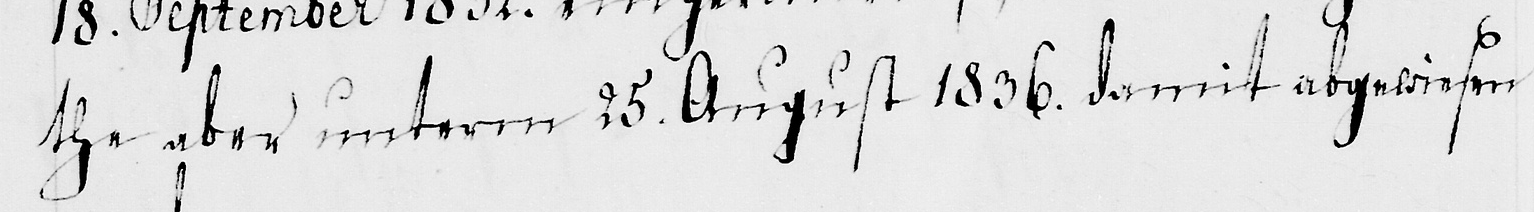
the aber unterm 25. August 1836. damit abgewiesen
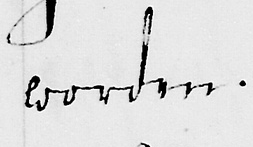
worden.
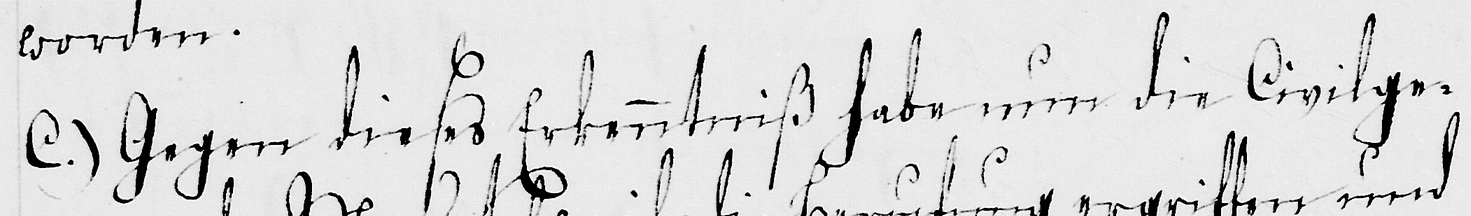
C.) Gegen dieses Erkenntniß habe nun die Civilge¬
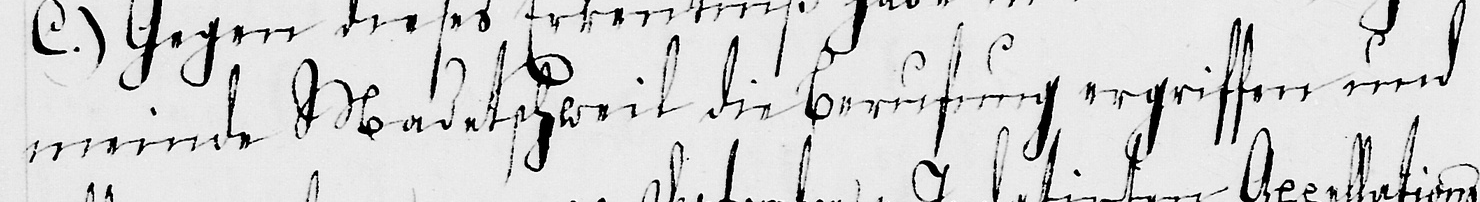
meinde Madetschweil die Berufung ergriffen und
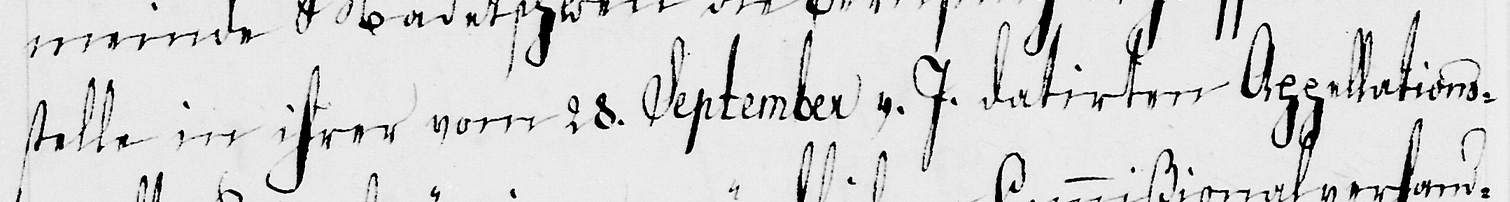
stelle in ihrer vom 28. September v. J. datirten Appellations¬
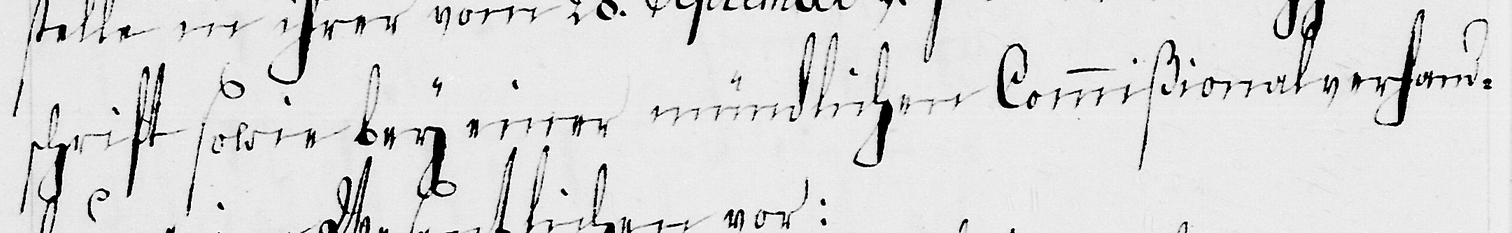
schrift sowie bey einer mündlichen Commißionalverhand¬
